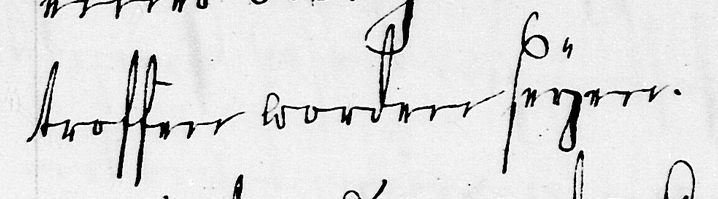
troffen worden seyen.
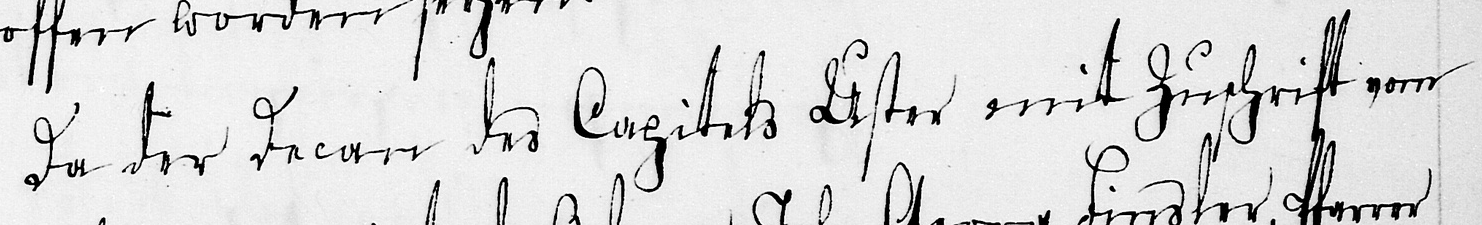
Da der Decan des Capitels Uster mit Zuschrift vom
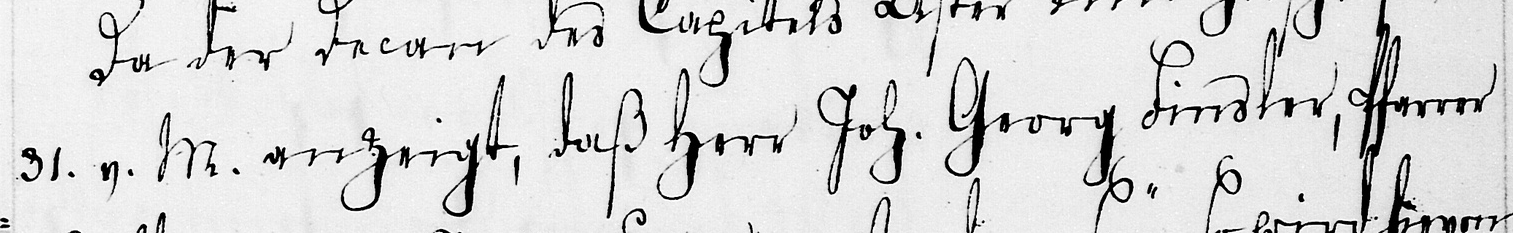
31. v. M. anzeigt, daß Herr Joh. Georg Finsler, Pfarrer
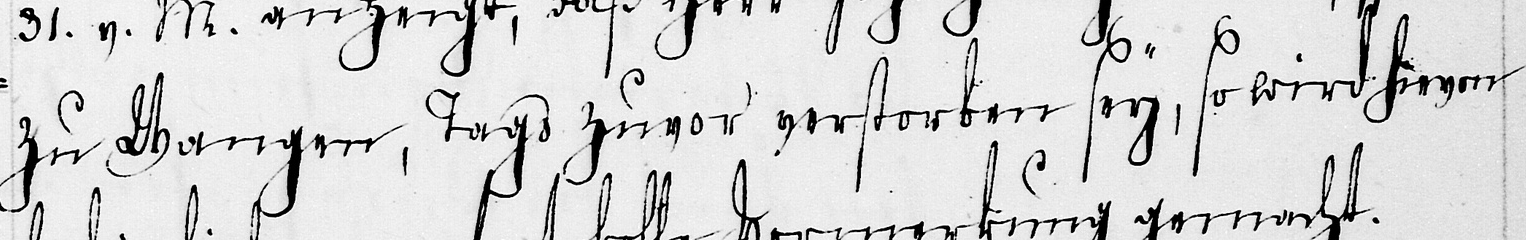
zu Wangen, Tags zuvor verstorben sey, so wird hievon
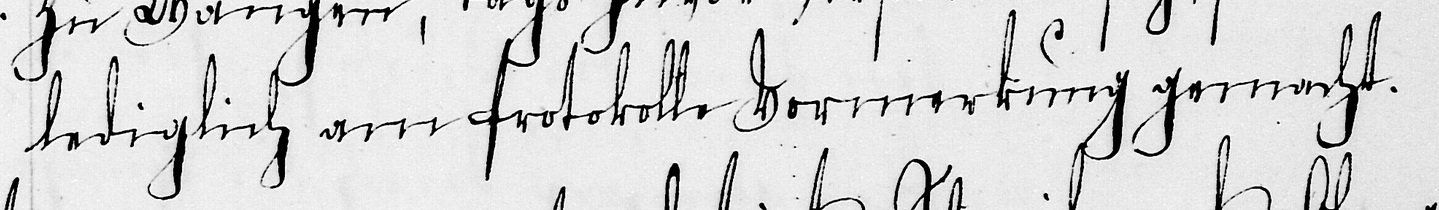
lediglich am Protokolle Vormerkung gemacht.
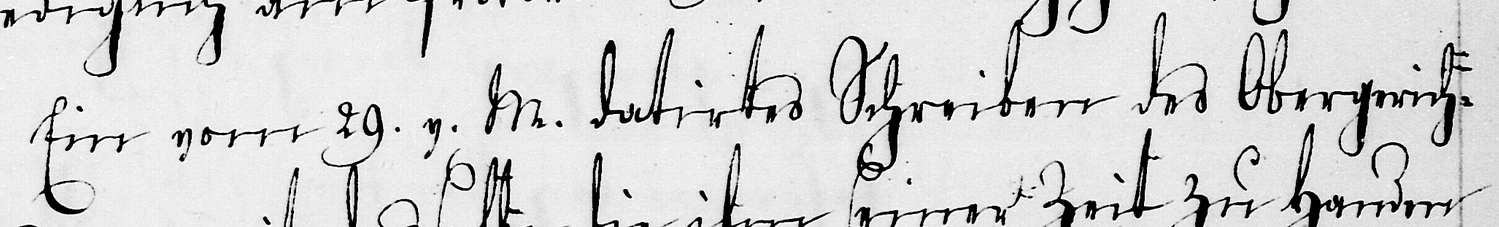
Ein vom 29. v. M. datirtes Schreiben des Obergerich¬
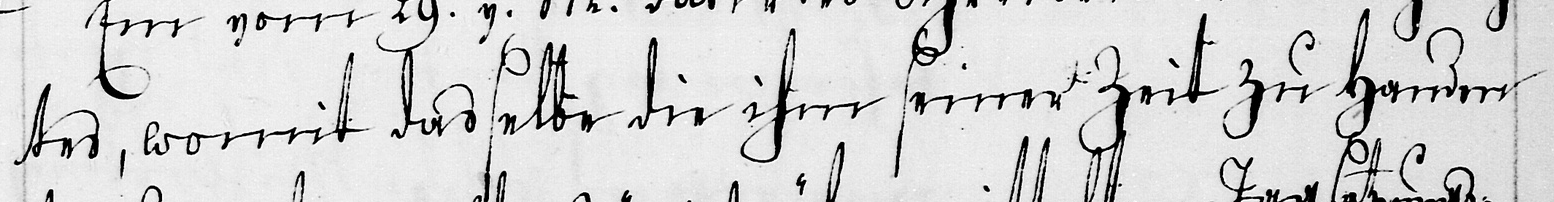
tes, womit dasselbe die ihm seiner Zeit zu Handen
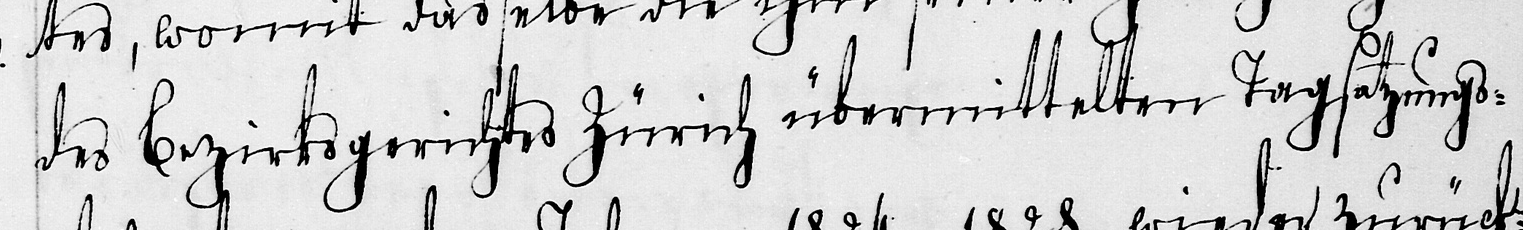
des Bezirksgerichtes Zürich übermittelten Tagsatzungs¬
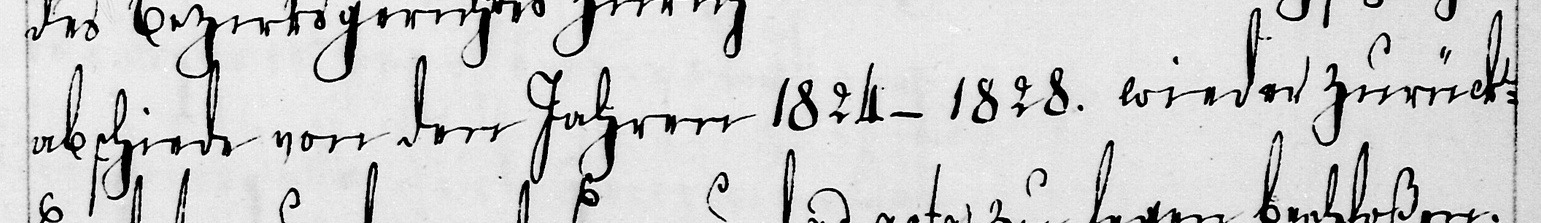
abschiede von den Jahren 1824–1828. wieder zurück¬
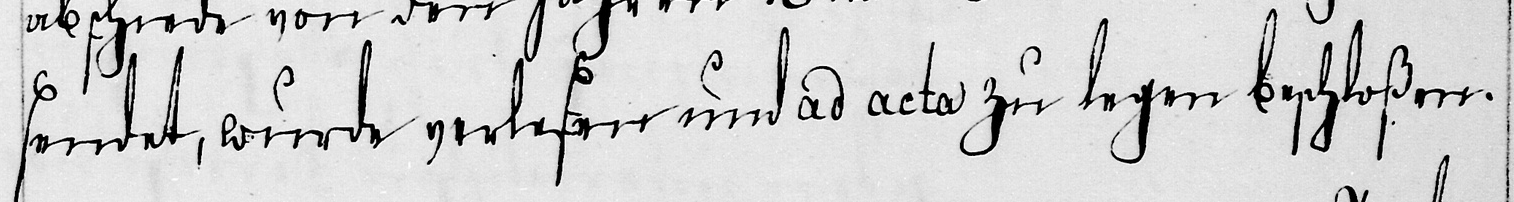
sendet, wurde verlesen und ad acta zu legen beschloßen.
